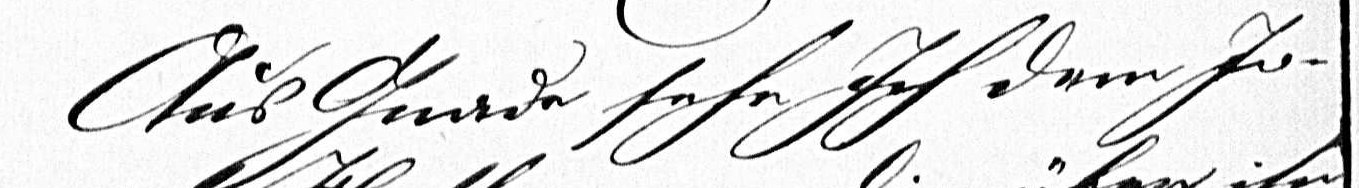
Aus Gnade sehe Jch dem Jo¬
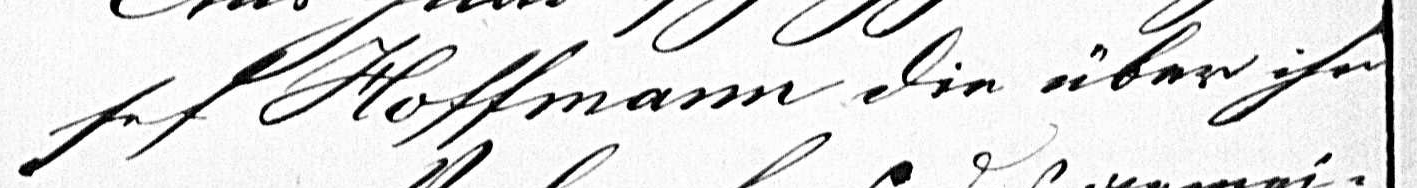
sef Hoffmann die über ihn
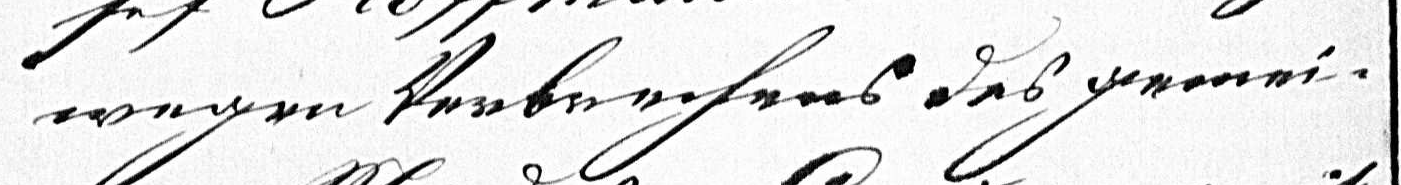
wegen Verbrechens des gemein¬
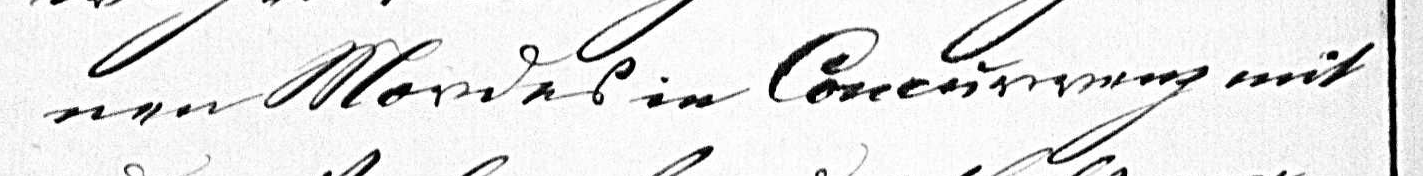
nen Mordes in Concurrenz mit
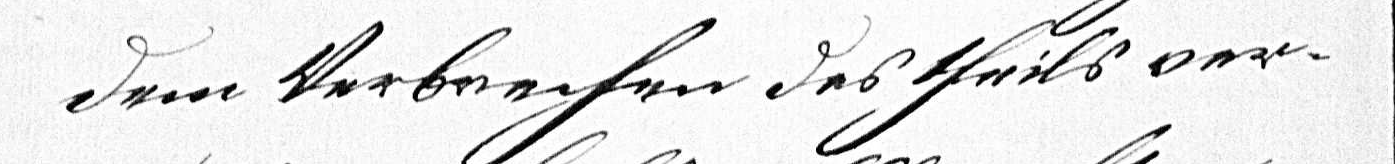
dem Verbrechen des theils ver¬
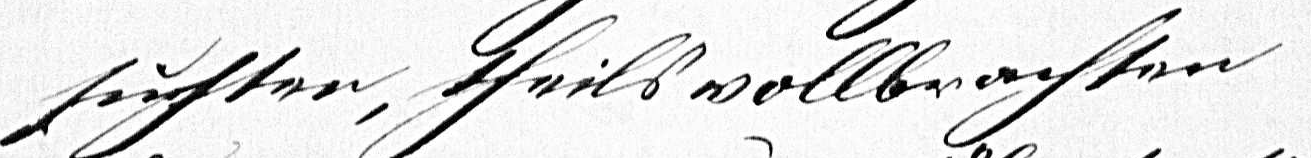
suchten, theils vollbrachten
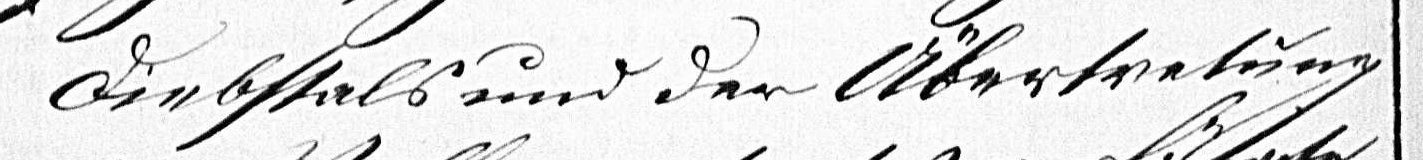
Diebstals und der Übertretung
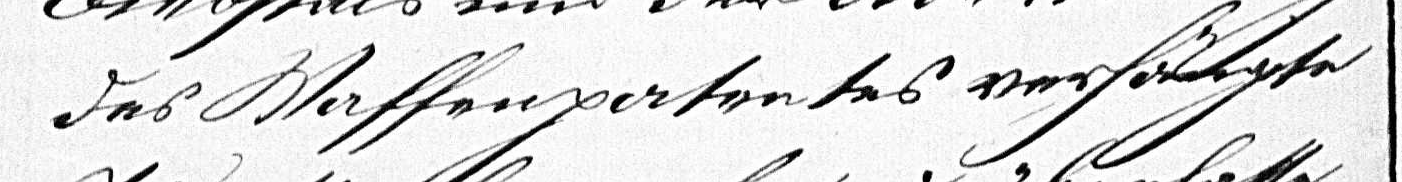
des Waffenpatentes verhängte
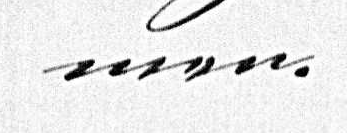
men.
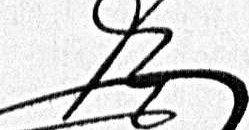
xx
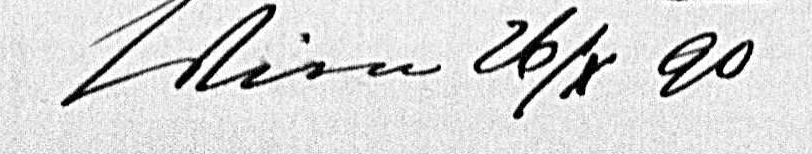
Wien 26/X 90
